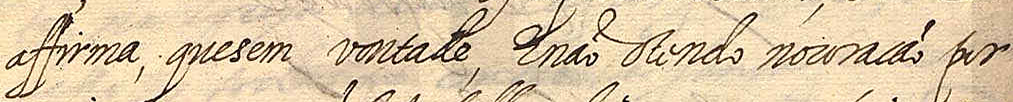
affirma, que sem vontade, E naõ o tendo no coraçaõ por
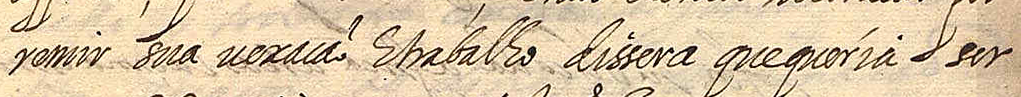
remir sua uexaçaõ E trabalho dissera que queria ser
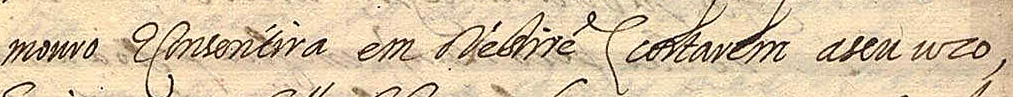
mouro E Consentira em o Vestirē e cortarem a seu uzo,
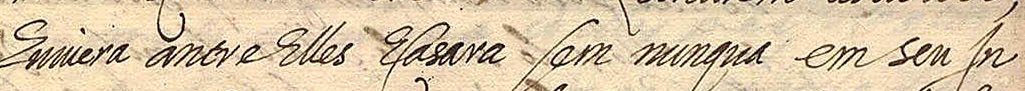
E uiuera antre Elles E Casara sem nunqua em seu Jn
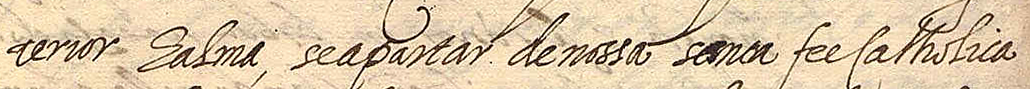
terior E alma, se apartar de nossa santa fee Catholica
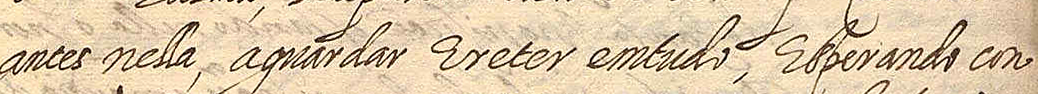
antes nella, a guardar E reter em tudo, Esperando con
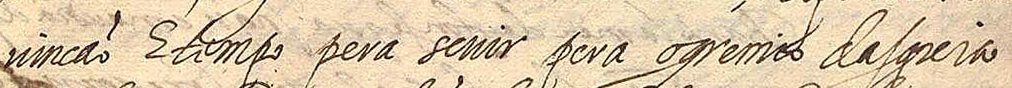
iunçaõ E tempo pera se uir pera o gremio da Jgreia
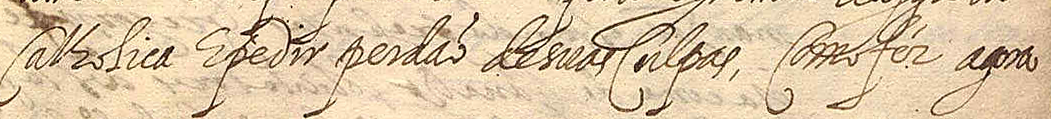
Catholica E pedir perdaõ de suas Culpas, Como fez agora
